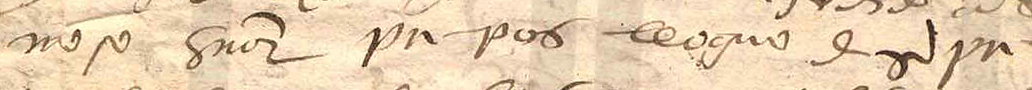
noso Snōr prepos lloguo de sēpre
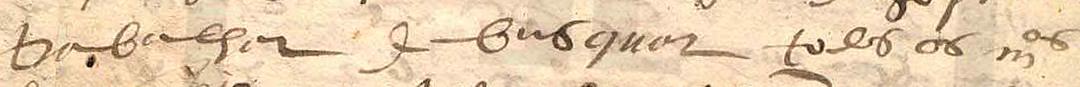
trabalhar de busquar todos os mos
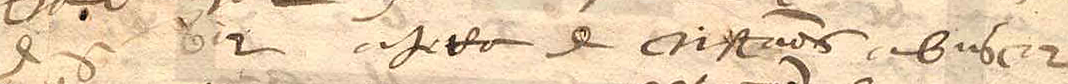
de se vir a teRa de cristãos a buscar
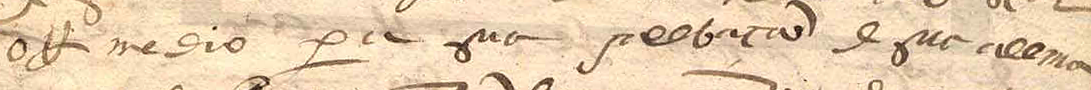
o Remedio ꝑa sua sallvação de sua allma
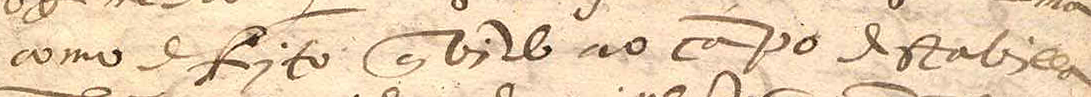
como de ffejto q̄ vīdo ao cāpo desta villa
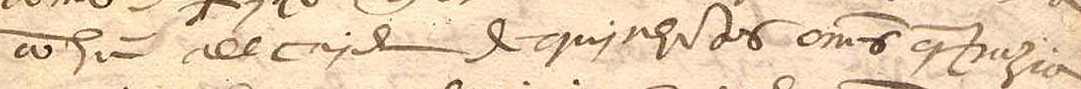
c̄o hū allcajde de qujnhētos omēs q̄ trazia
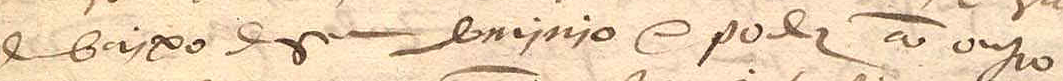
debajxo de seu domjnio e poder c̄o outro
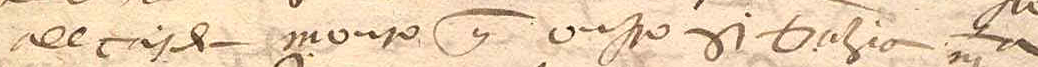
allcajde mouro q̄ outrosi trazia mta
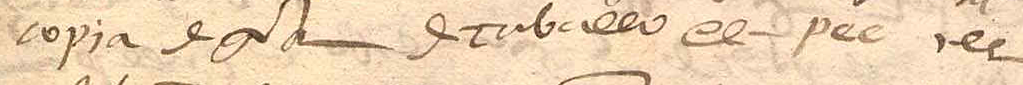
copia de gēte de cavallo e de pee elle
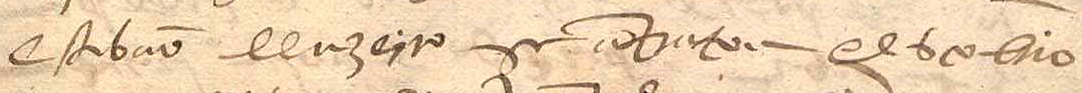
estevaõ lluzeiro se c̄otratou e descobrio
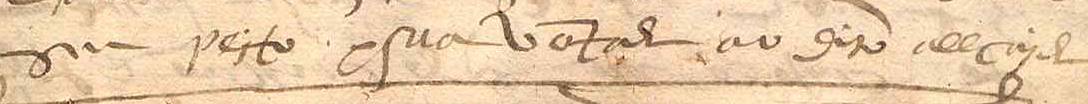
seu pejto e sua vōtade ao dito allcajde
